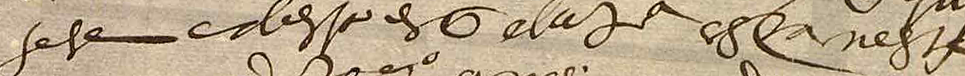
sese e despoes q̄ elle ta esta neste
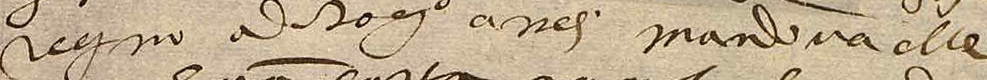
regno o dito go anes mandou a elle
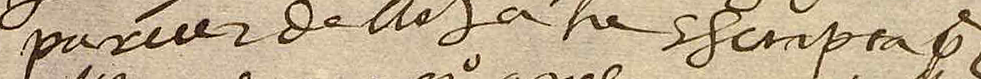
parecer delle ta he Escripta p̄o
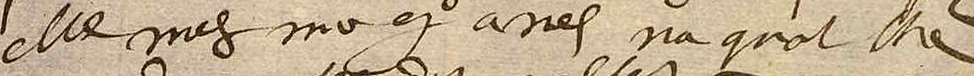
elle mesmo go anes na qual lhe
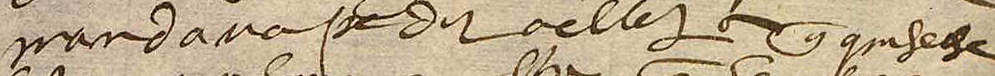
mandaua pedir a elle ta q̄ quisesse
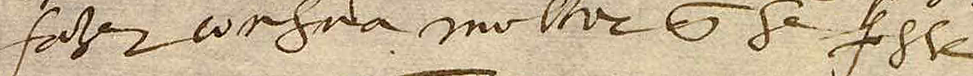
fazer con sua molher q̄ se fosse
